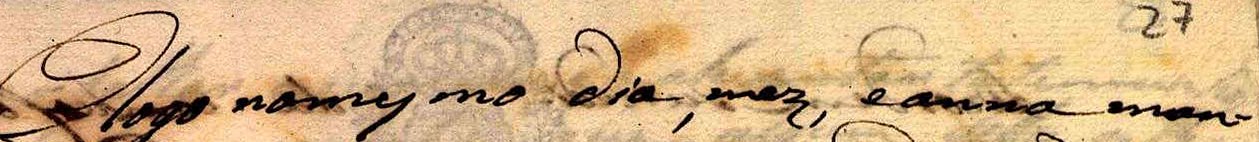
E logo no mesmo dia, mez, e anno man
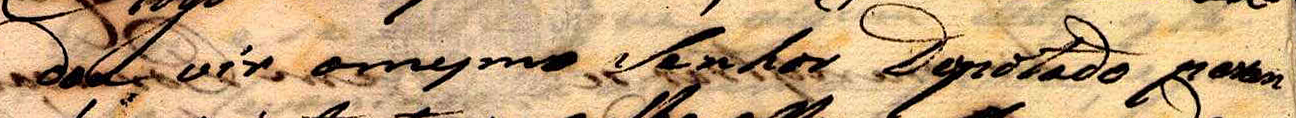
dou vir o mesmo Senhor Depotado peran
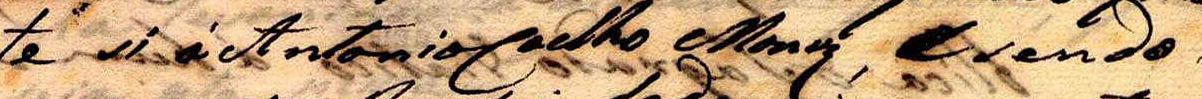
te si á Antonio Coelho Moniz E sendo
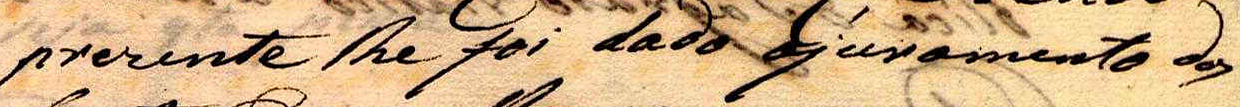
prezente lhe foi dado o juramento dos
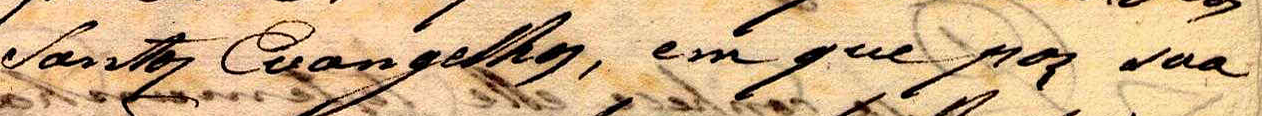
Santos Euangelhos, em que pos sua
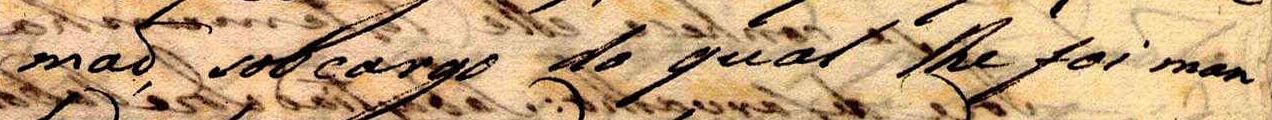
maõ, sob cargo do qual lhe foi man
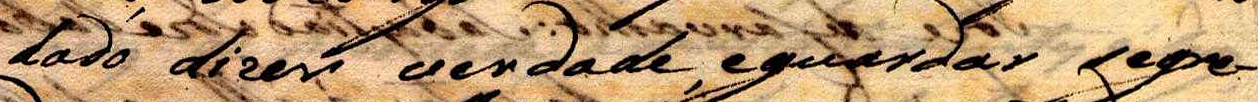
dado dizer verdade e guardar segre
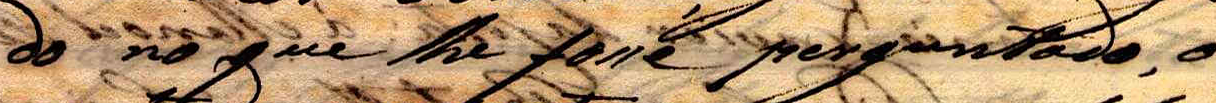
do no que lhe fosse perguntado, o
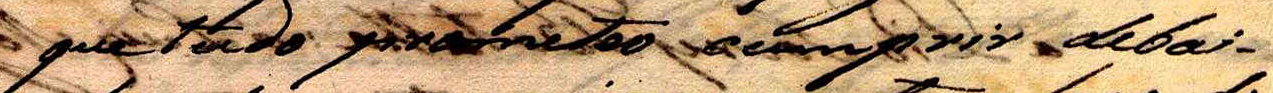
que tudo prometeo o cumprir debai
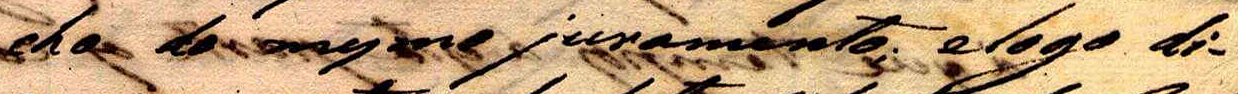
cho do mesmo juramento; e logo di
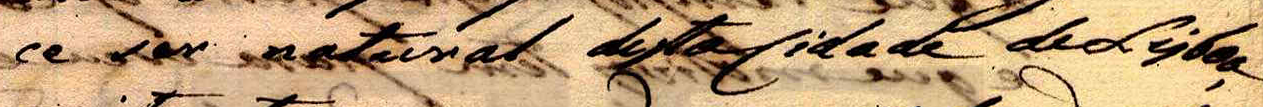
ce ser natural desta Cidade de Lisboa,
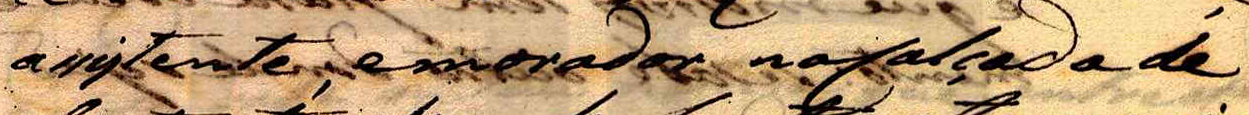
assistente, e morador na Calçada de
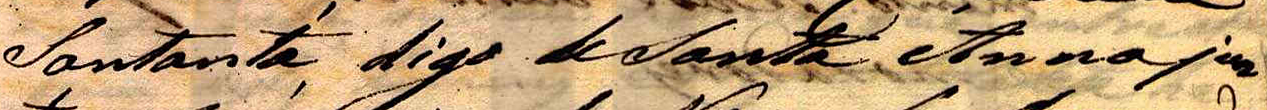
Santanta, digo de Santa Anna jus
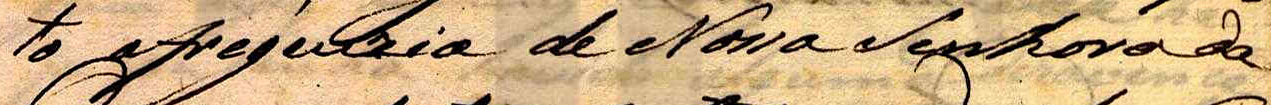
to a freguezia de Nossa Senhora da
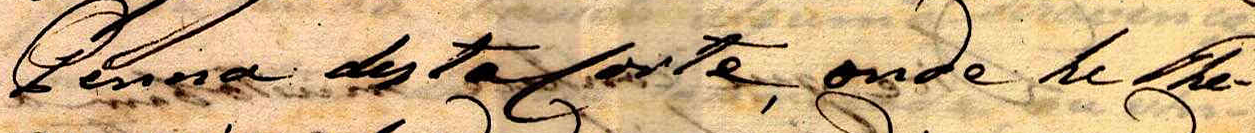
Penna desta Corte, onde he The
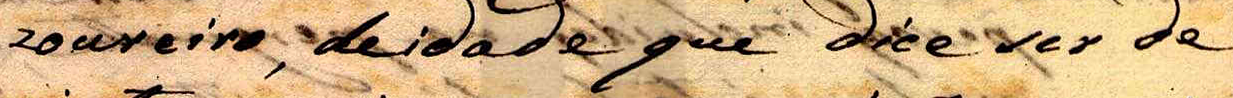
zoureiro, de idade que dice ser de
